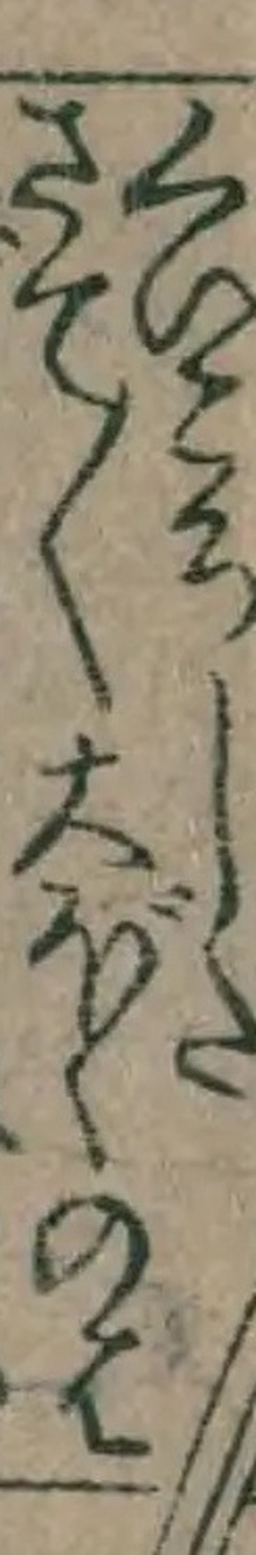さて〳〵大ぼくのは
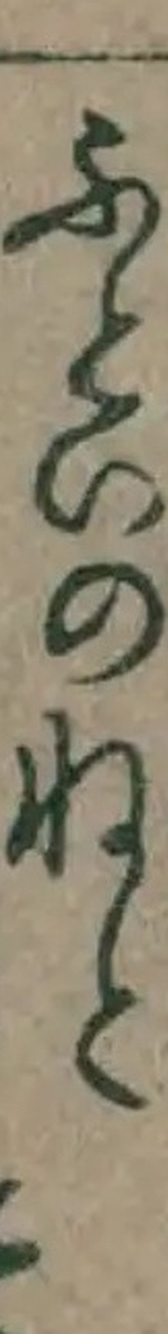ふといのねと
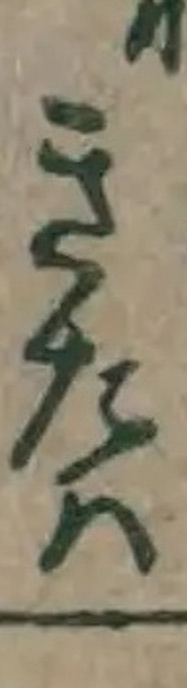きたは

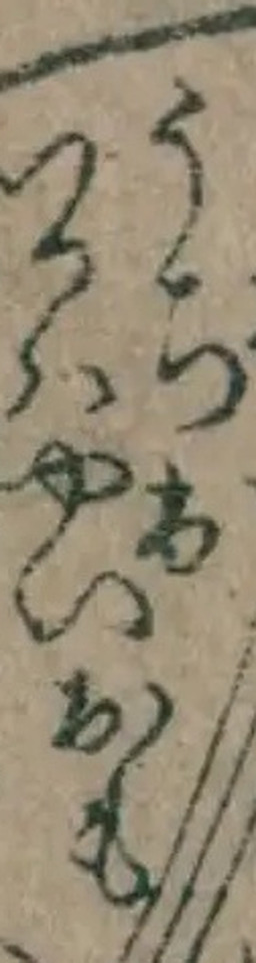いるはやいおも
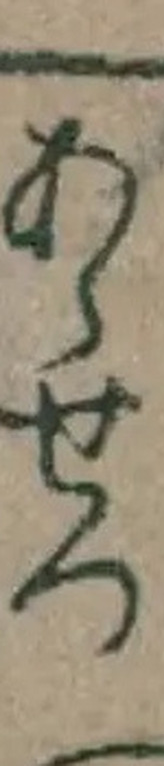ああせつ
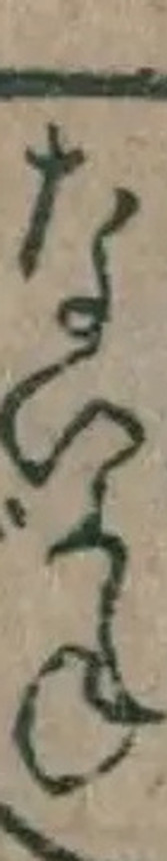ないかね
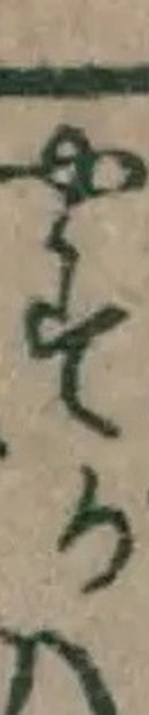やすが
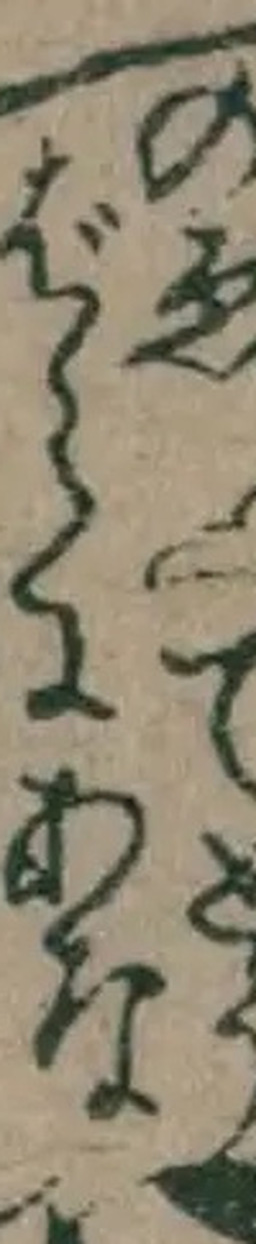ばらにあな
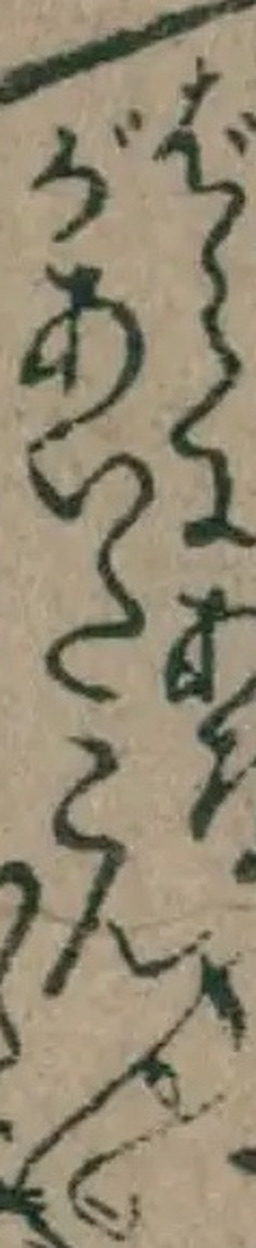があいたこん
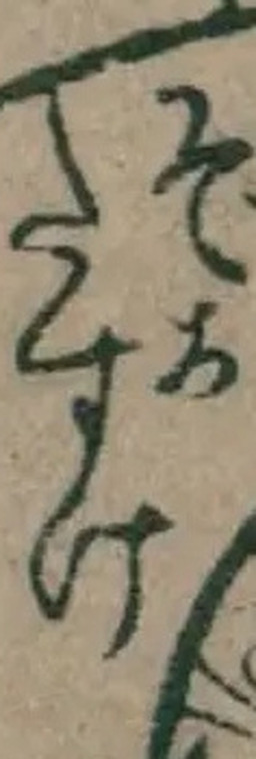たすけ

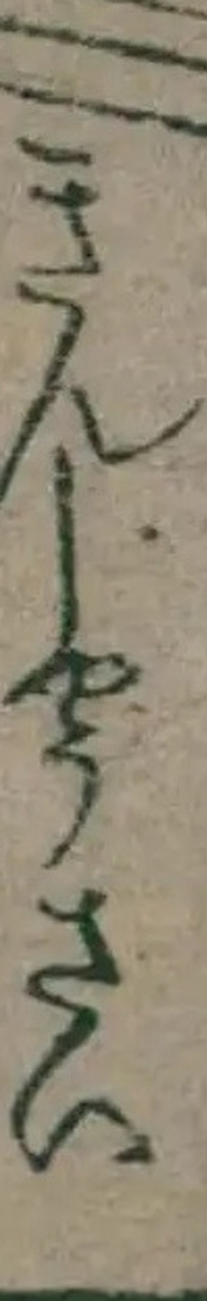きんしやうさい
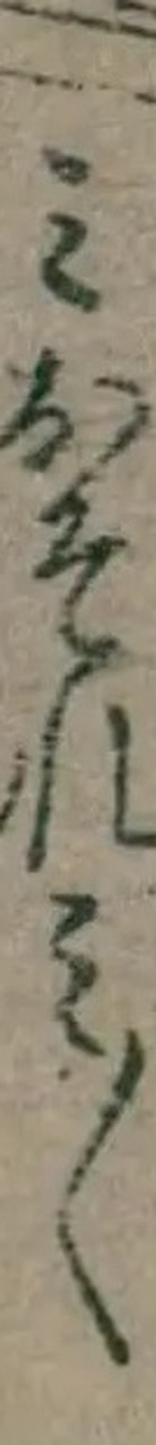みおそれみ〳〵
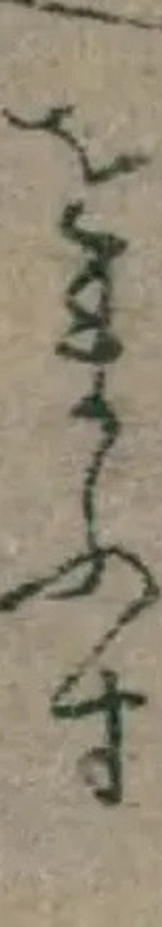をまふす
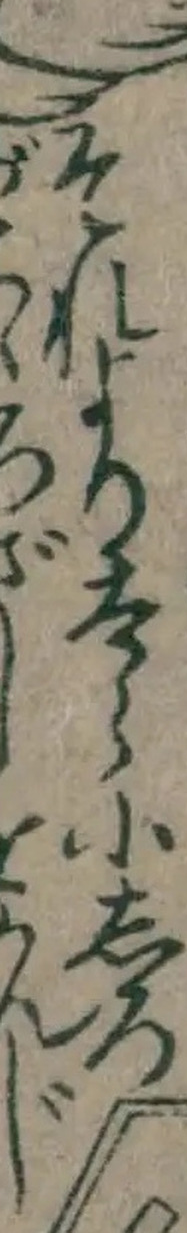それより太郎こしろ
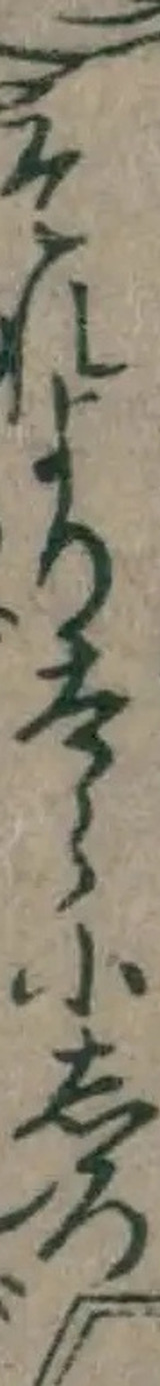それより太郎こしろ
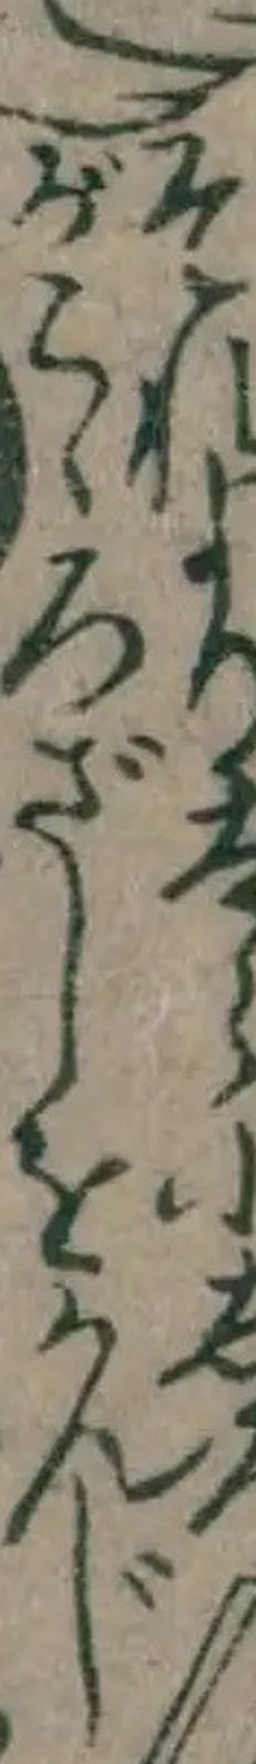がこころざしをかんじ
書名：団十郎蓬芥伝
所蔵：国立国会図書館 National Diet Library, JAPAN
